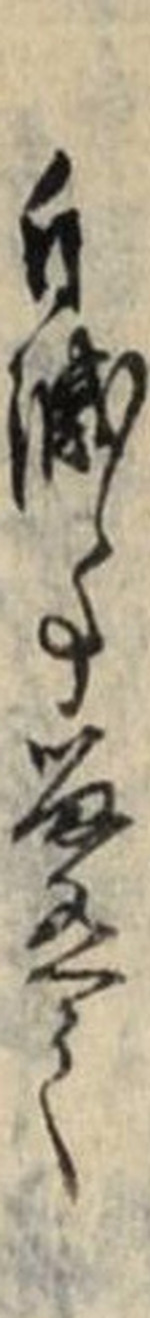自滅候事留有之
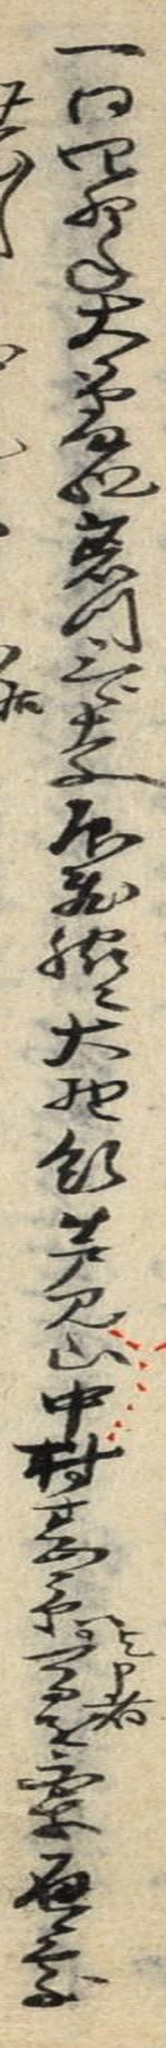一同四卯年大御番組荒川三郎大夫屋敷脇に大野領芦見山中村甚兵衛と申者馬を牽通候処
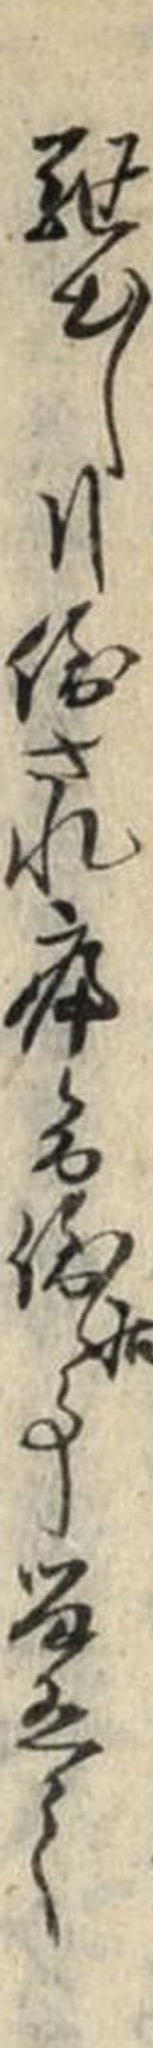駆出し引倒され痛に而倒居候事留有之
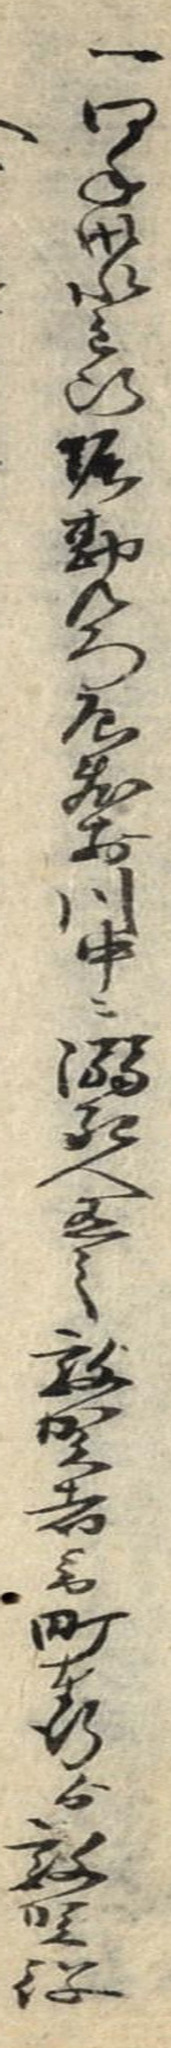一同年御水主頭堀勘左衛門屋敷前川中に溺死人有之敦賀者に而町奉行ゟ敦賀役
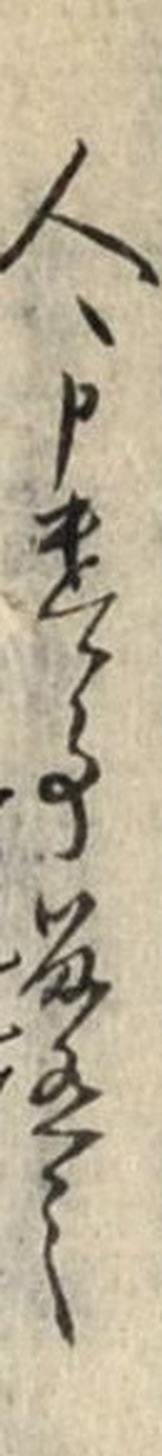人へ申遣候事留有之
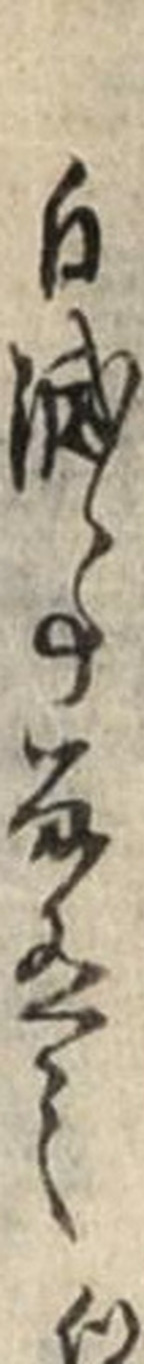自滅候事留有之
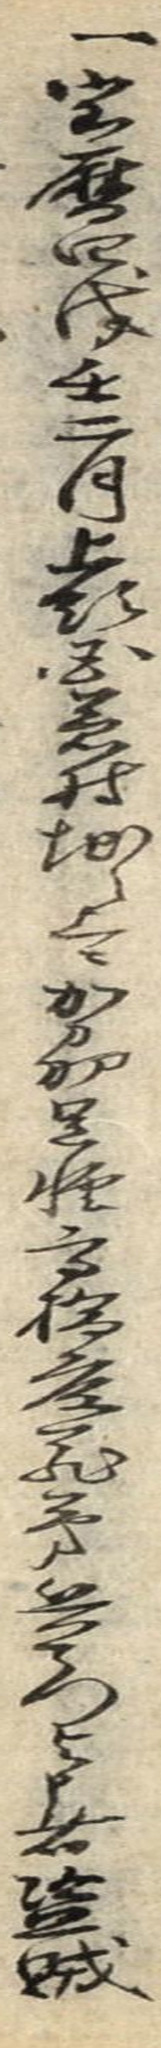一宝暦四戌閏二月上領国兼村地之上に加州足軽高橋藤蔵弟兵右衛門と申者盗賊
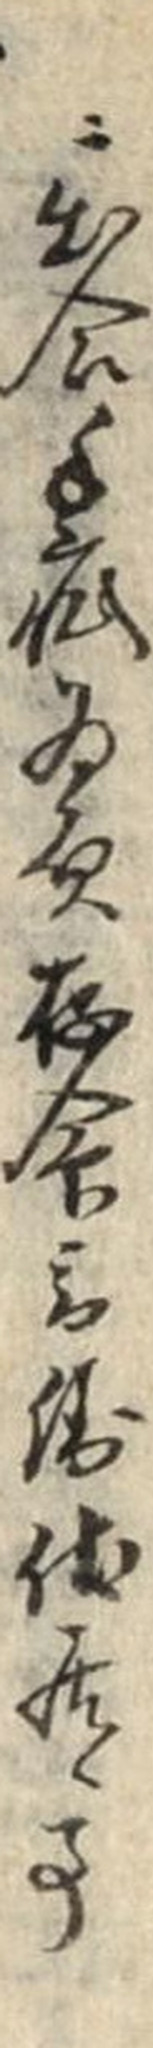に出合手疵為負存命に而倒伏居候事
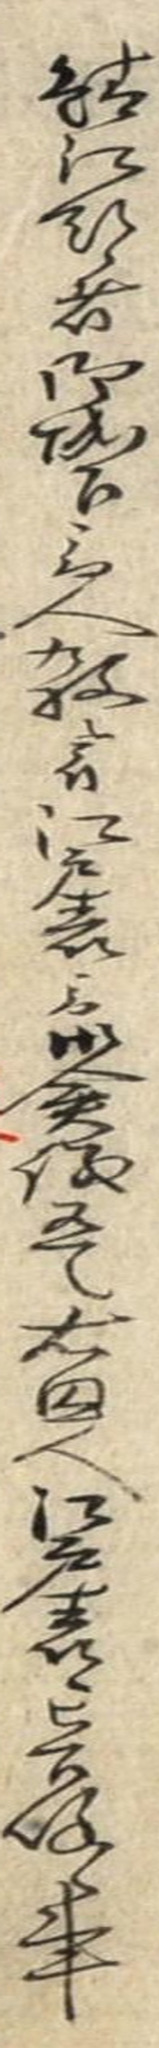一鯖江領之者御城下に而人殺に付江戸表に而御僉儀有之右囚人江戸表へ被召呼候事
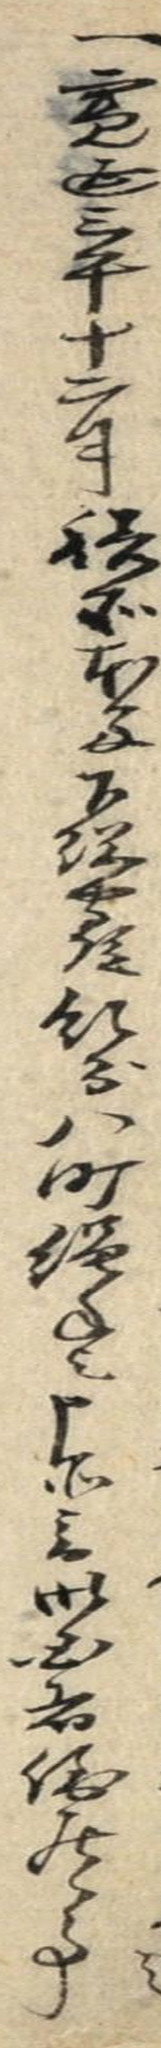一寛延三午十二月膳所本多下総守殿領分八町縄手と申所に而御国者倒居候事

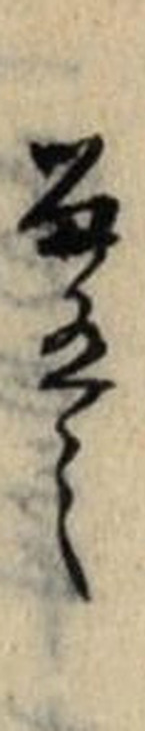留有之
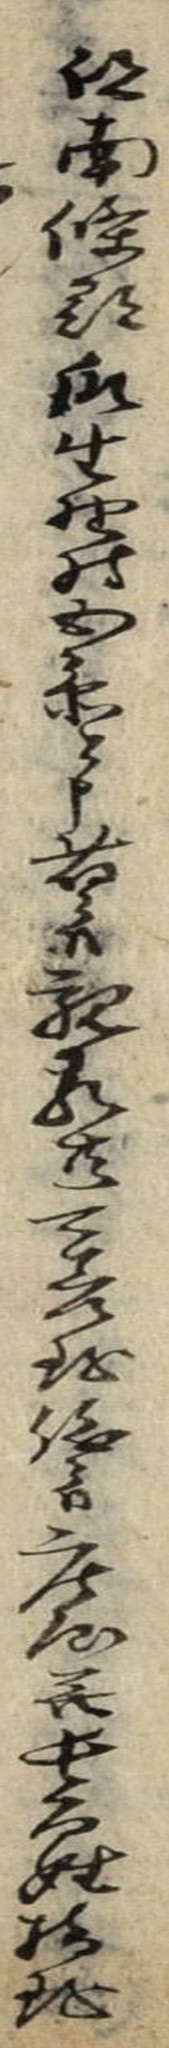但南條郡瓜生野村五兵衛と申者に付親類共可差越儀に付庄屋并長百姓指越
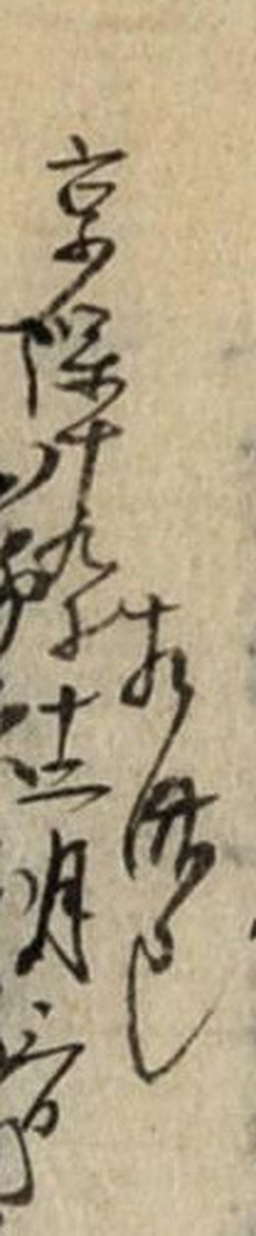享保十九刁十二月三日
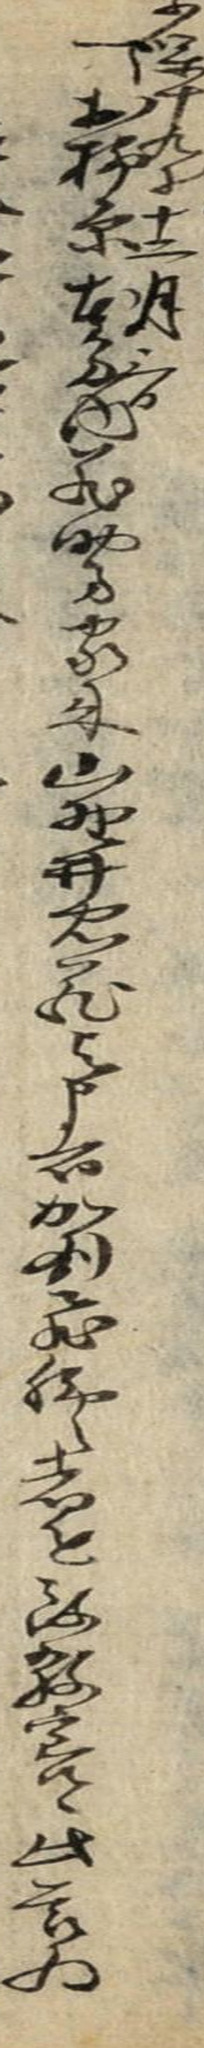一於柳原本多内蔵助方家来山野井忠蔵と申者加州飛脚之者を致殺害候此節為
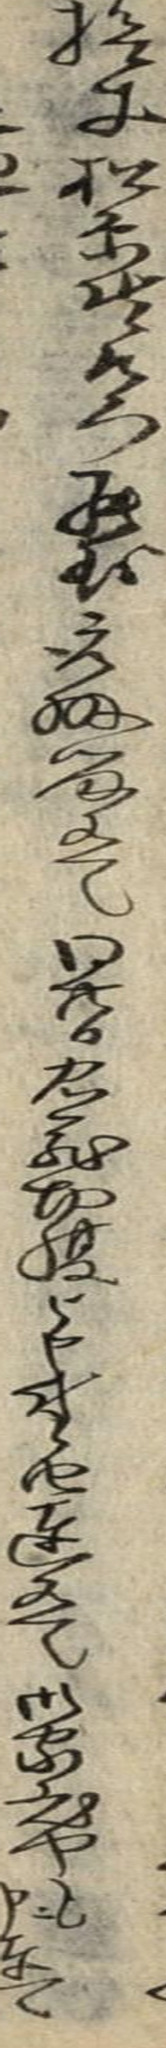検使松原次郎左衛門罷越取扱留有之同廿日忠蔵切腹被申付候由達有之御家老中へも申達候
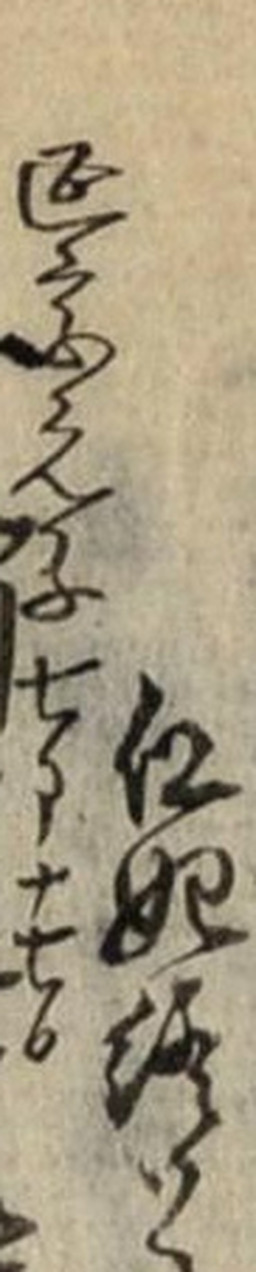延享元子七月十七日
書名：御停止異変死失
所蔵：福井県文書館 Fukui Prefectural Archives
